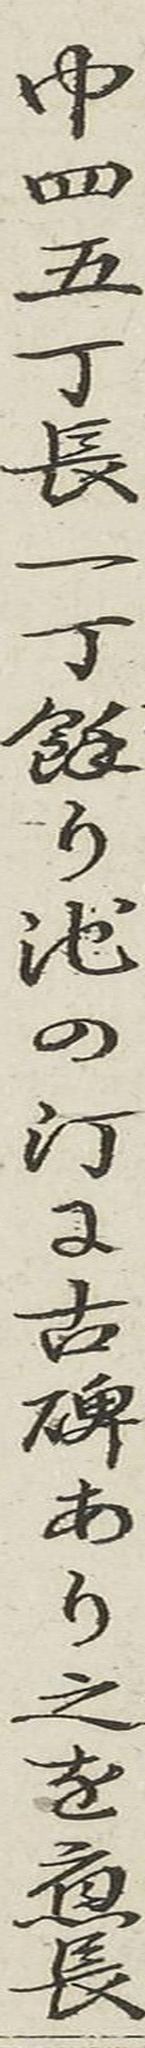巾四五丁長一丁餘り池の汀に古碑あり之を応長
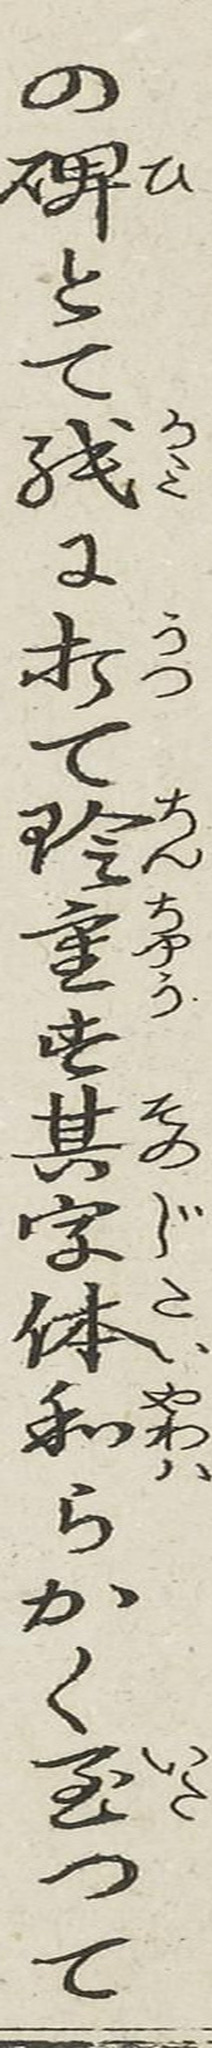の碑とて紙に打て珍重す其字体和らかく至つて
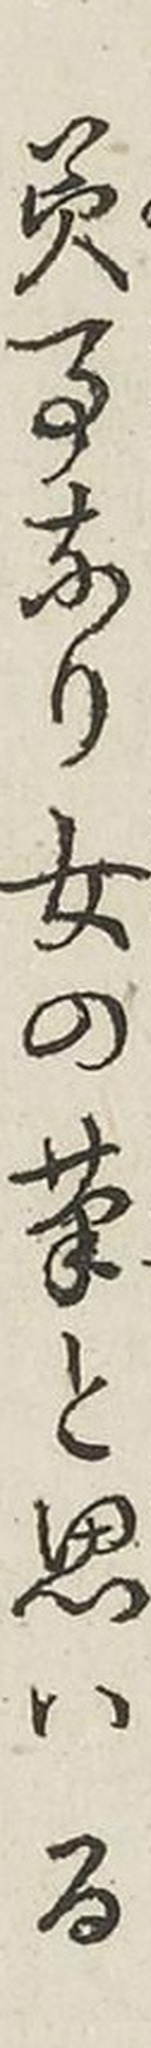美事なり女の筆と思はる
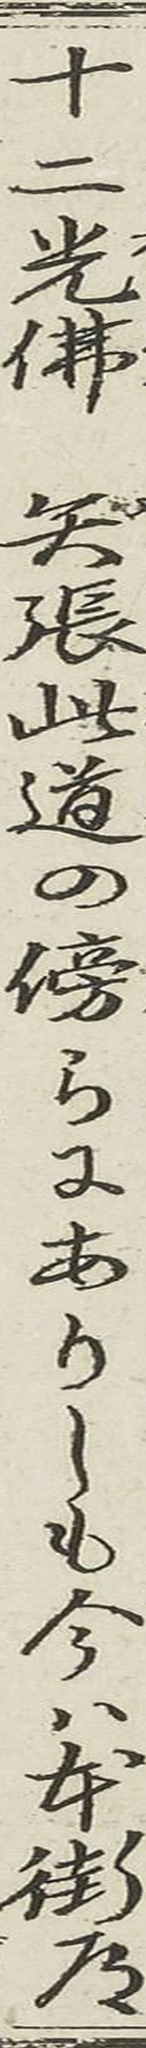十二光佛矢張此道の傍らにありしも今は本街道
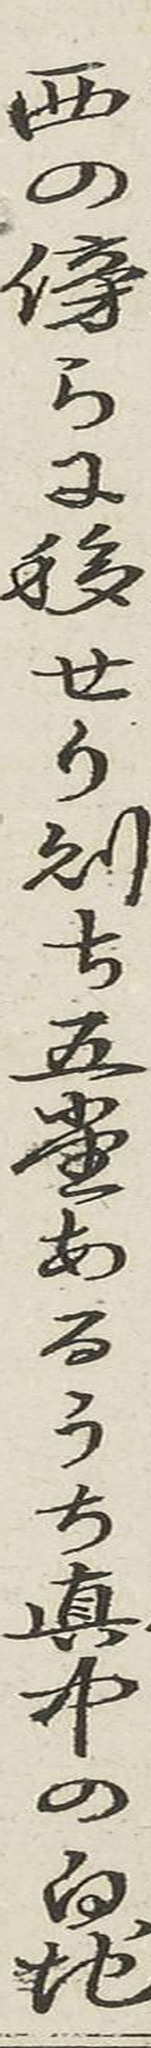西の傍らに移せり即ち五堂あるうち真中の白地
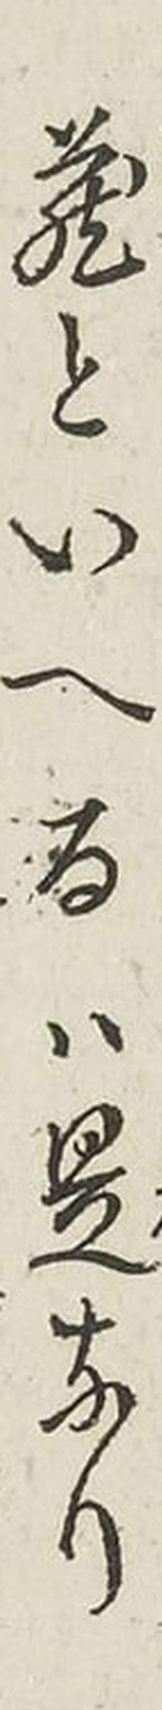蔵といへるは是なり
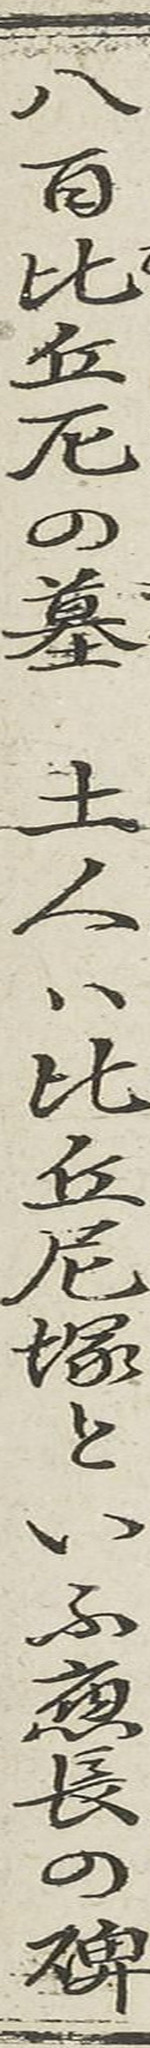八百比丘尼の墓土人は比丘尼塚といふ応長の碑
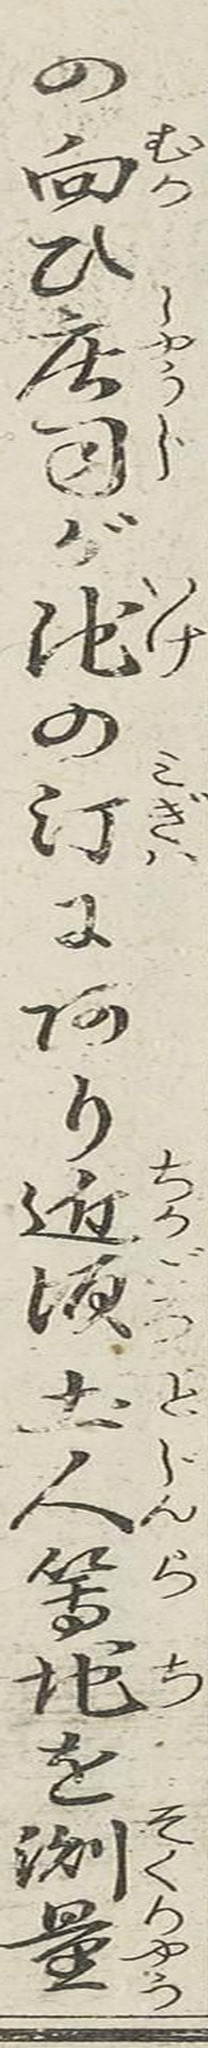の向ひ庄司が池の汀にあり近頃土人等地を測量
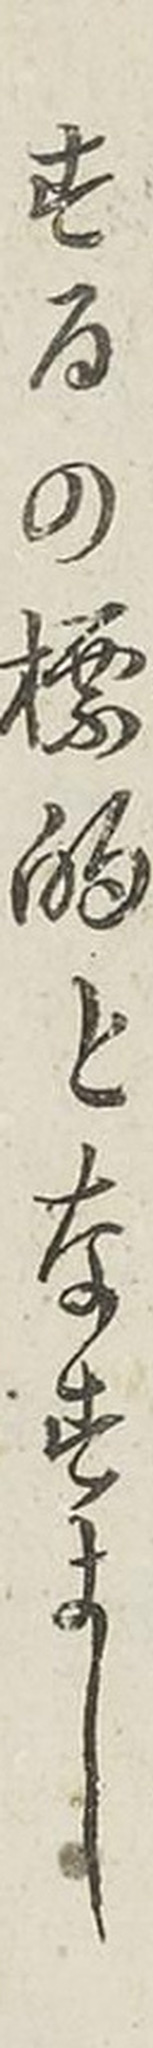するの標的となすよし
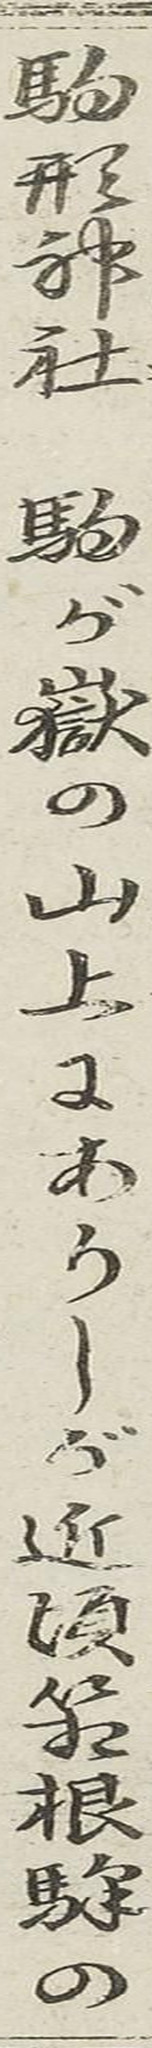駒形神社駒が嶽の山上にありしが近頃箱根驛の
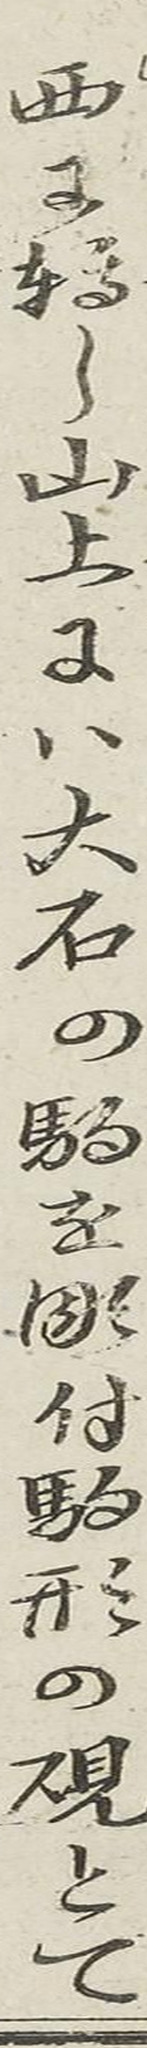西に転し山上には大石の駒を彫付駒形の硯とて
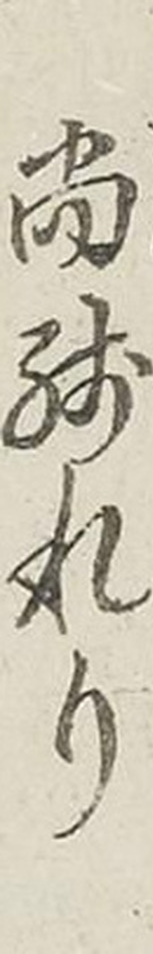尚残れり
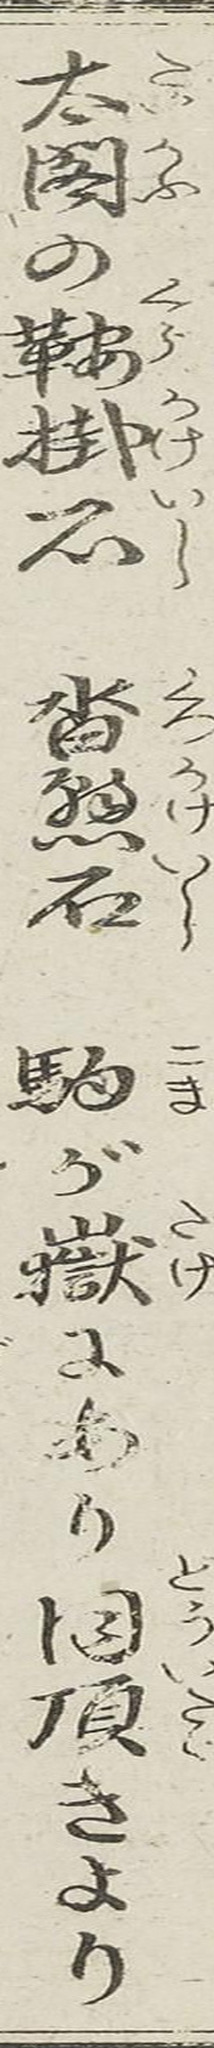太閤の鞍掛石沓懸石駒が嶽にあり同頂きより
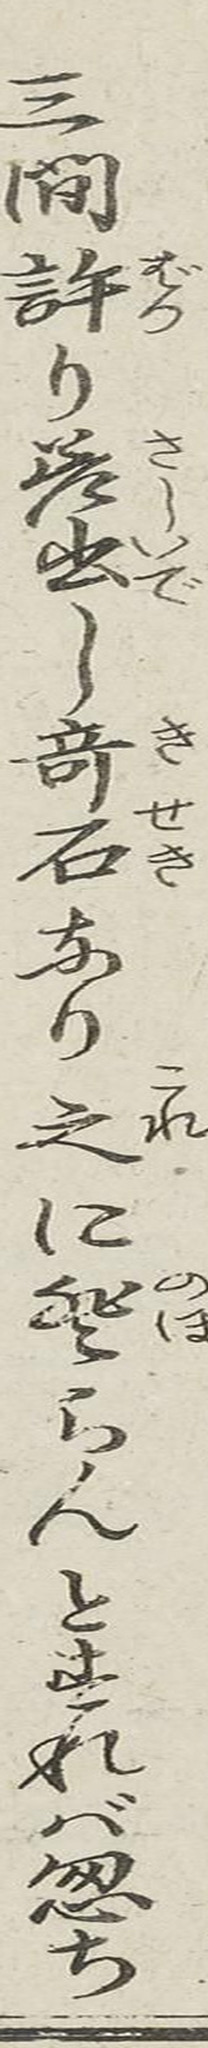三間許り差出し奇石なり之に登らんとすれば忽ち
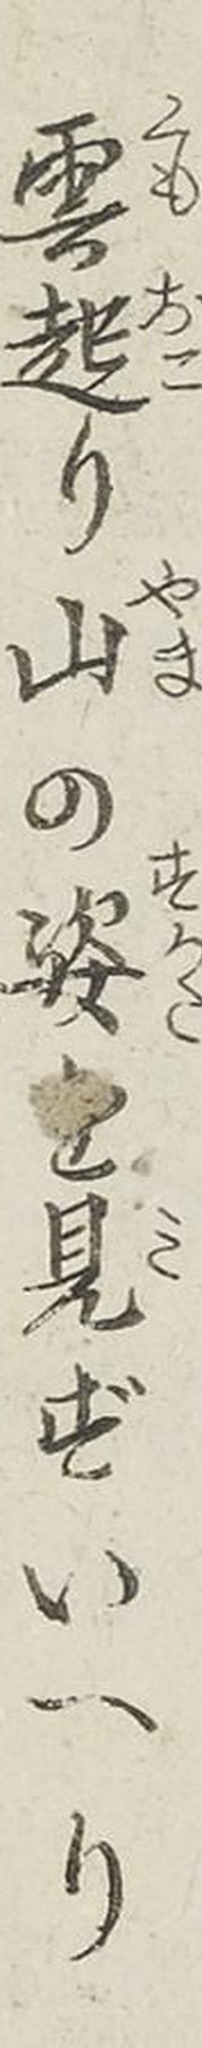雲起り山の姿を見ずいへり
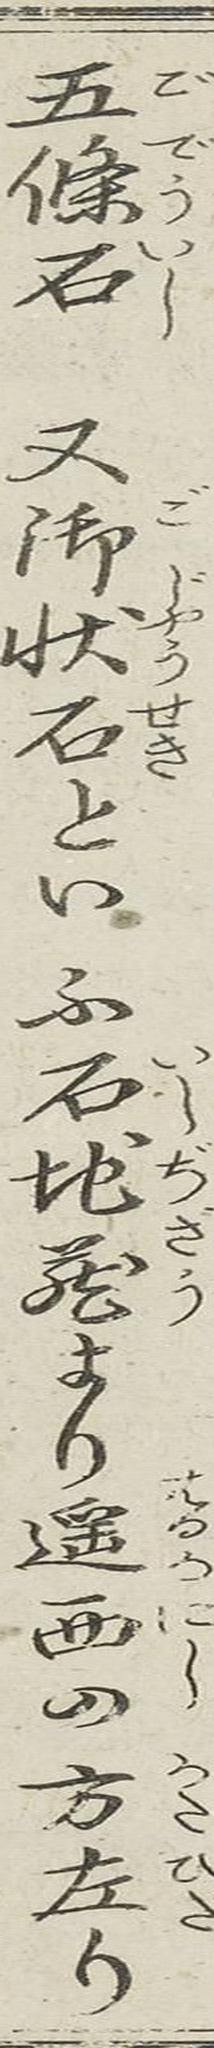五條石又御状石といふ石地蔵より遥西の方左り
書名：箱根温泉誌　全
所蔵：東京大学地震研究所図書室 Earthquake Research Institute Library, The University of Tokyo, JAPAN
